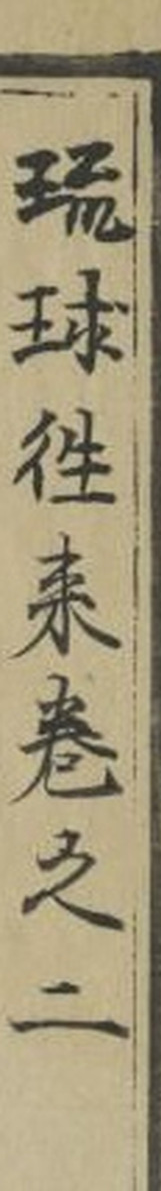琉球往来巻之二
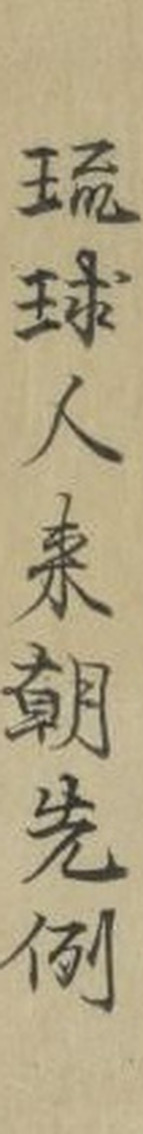琉球人来朝先例
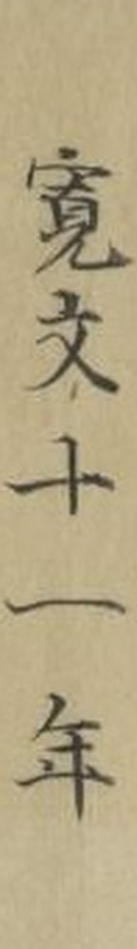寛文十一年
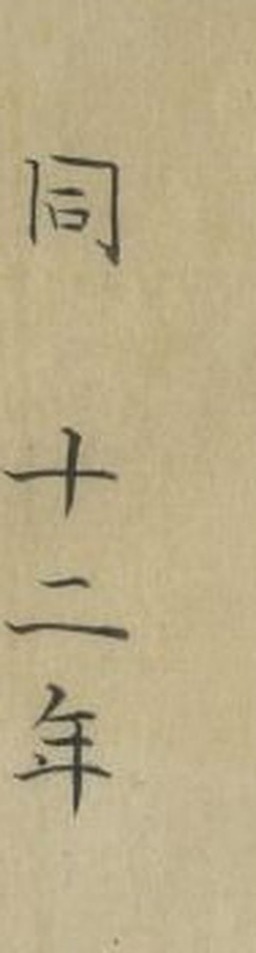同十二年
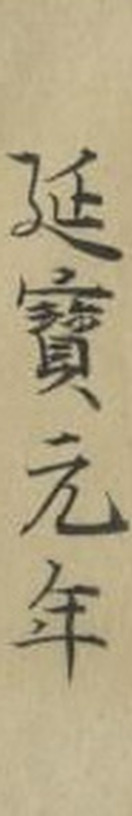延宝元年

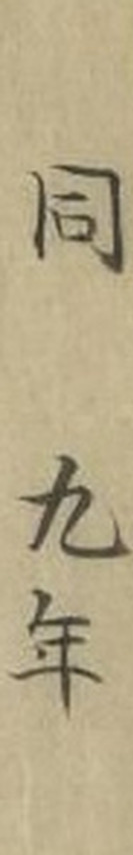同九年
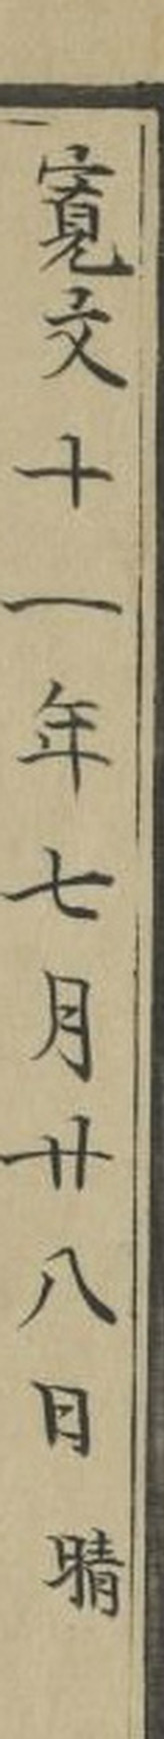寛文十一年七月廿八日晴
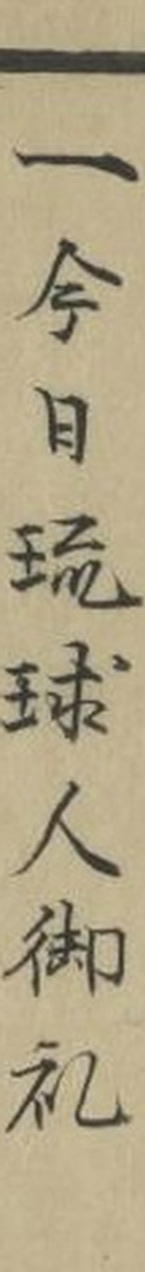一今日琉球人御礼
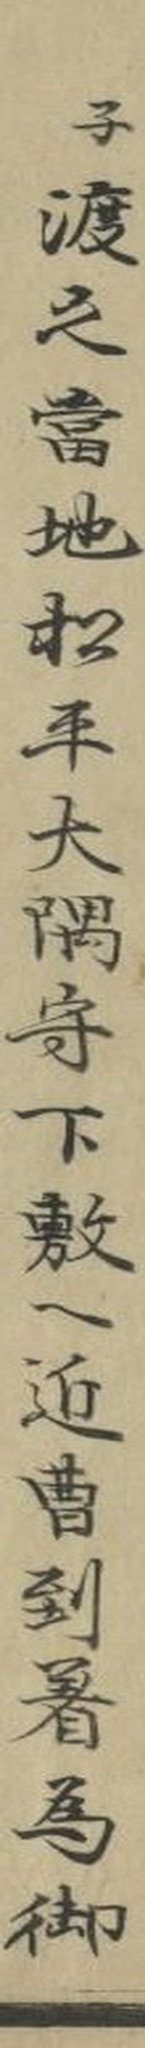子渡之当地松平大隅守下敷へ近曽到着為御
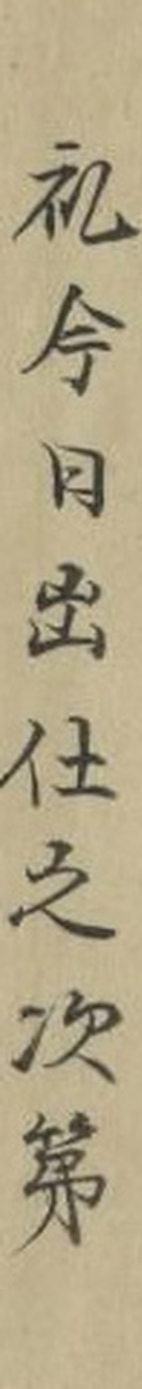礼今日出仕之次第
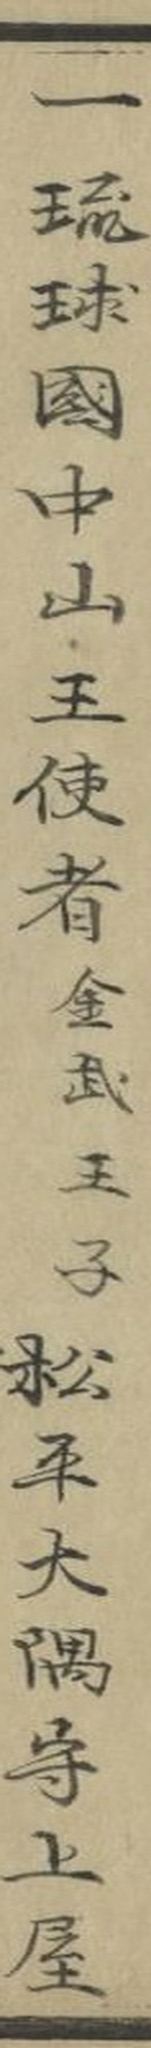一琉球国中山王使者金武王子松平大隅守上屋
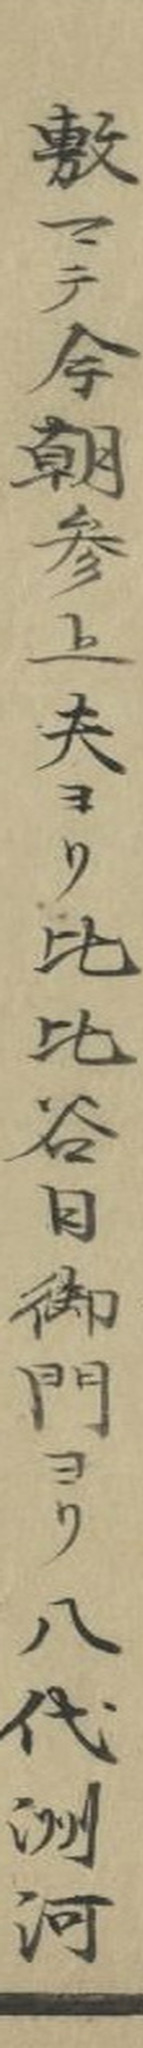敷マテ今朝参上夫ョㇼ比比谷目御門ョㇼ八代洲河
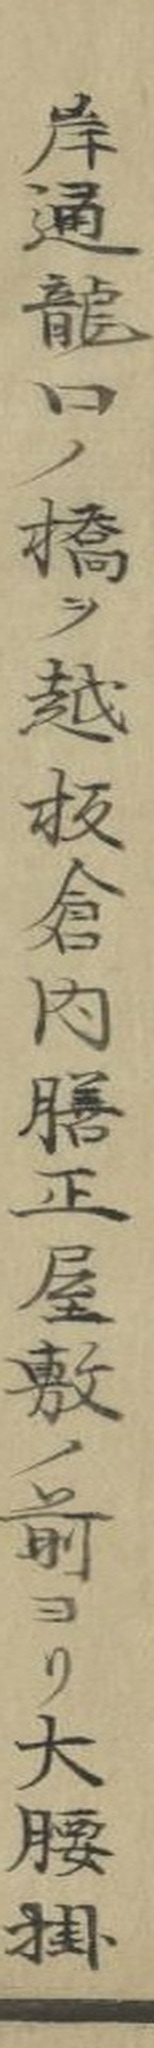岸通龍口ノ橋ヲ越板倉内膳正屋敷ノ前ョㇼ大腰掛
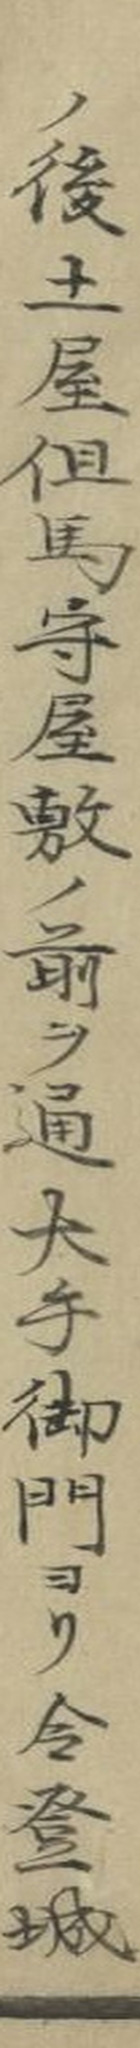ノ後土屋但馬守屋敷ノ前ヲ通大手御門ョㇼ令登城
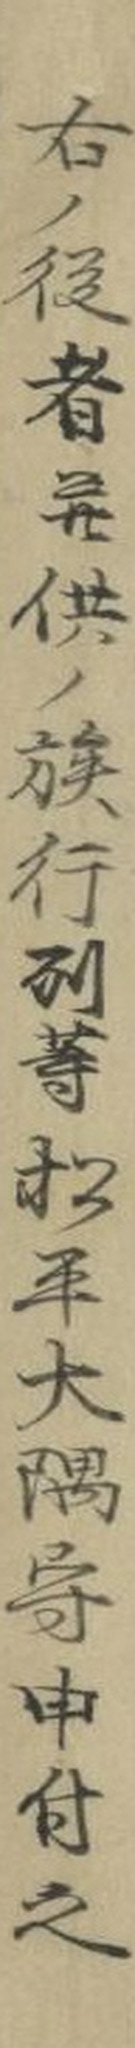右ノ従者幷供ノ族行列等松平大隅守申付之

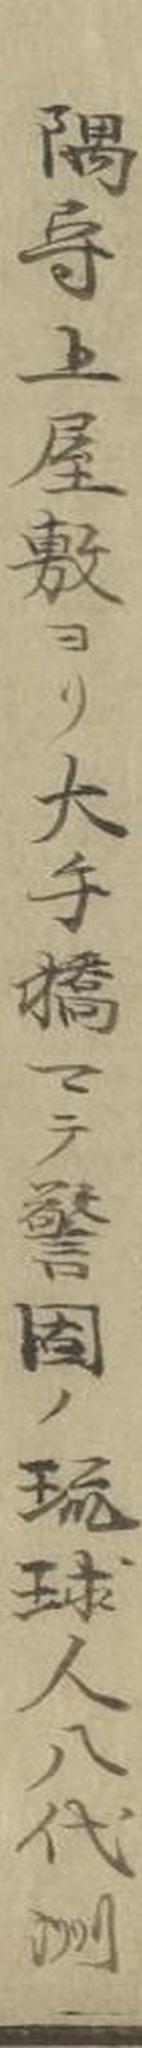隅守上屋敷ョㇼ大手橋マテ警固ノ琉球人八代洲
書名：琉球往来（下）
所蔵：University of the Ryukyus Library
